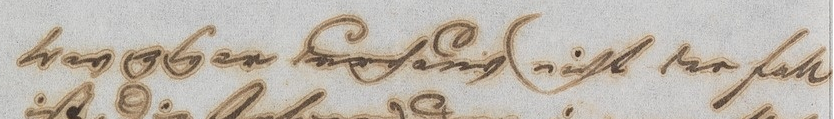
was zwar durchaus nicht der Fall
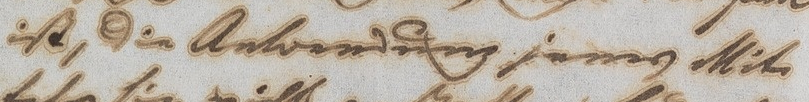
ist, die Anwendung jenes Mit-
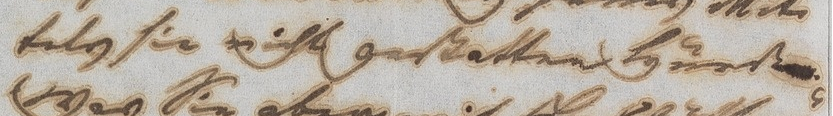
tels sie nicht gestatten würde.
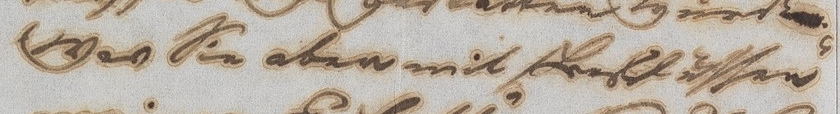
Was sie aber mit «Beschlüssen»
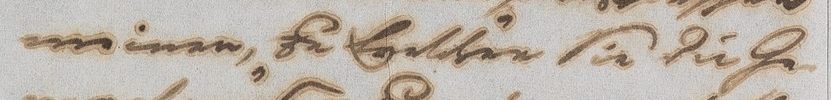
meinen, «zu welchen Sie die Ge-
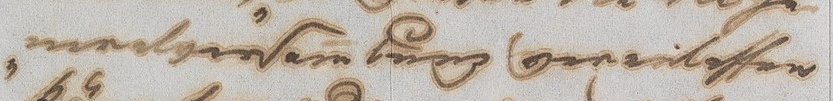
neralversammlung veranlassen
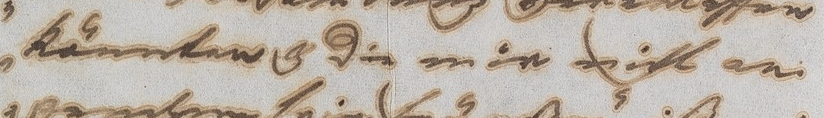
könnten & die mir nicht an-
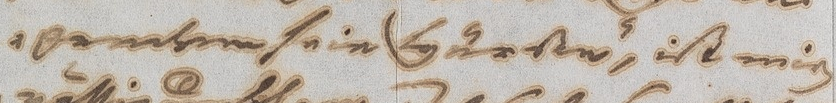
genehm sein würden», ist mir
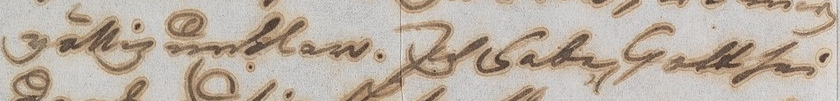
völlig unklar. Ich habe, Gott sei
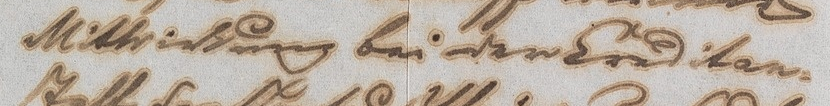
Mitwirkung bei der Creditan-
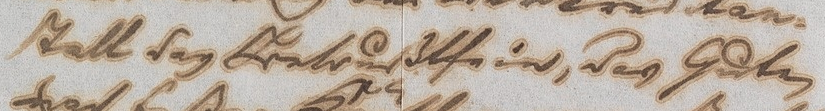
stalt das Bewußtsein, das Gute
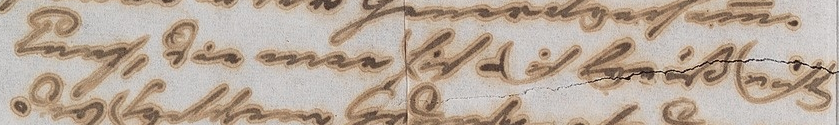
lung, die man sich – ich weiß nicht
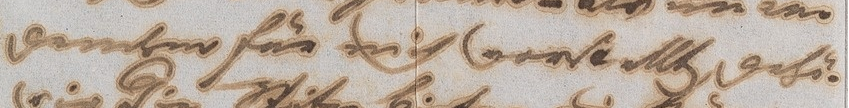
genehm für mich vorstellt, gehö-
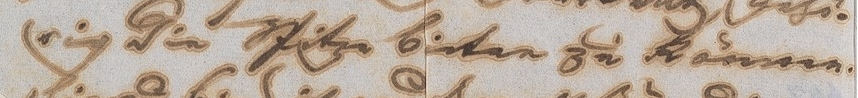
rig die Spitze bieten zu können.
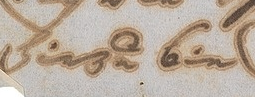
Hiezu bin
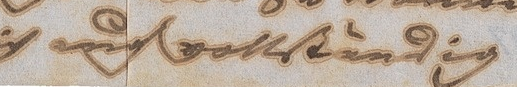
ich auch vollständig
